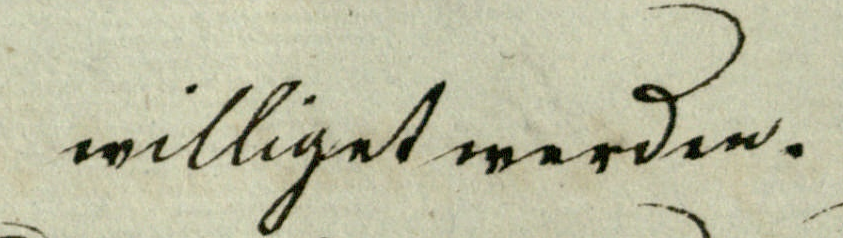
williget werden.
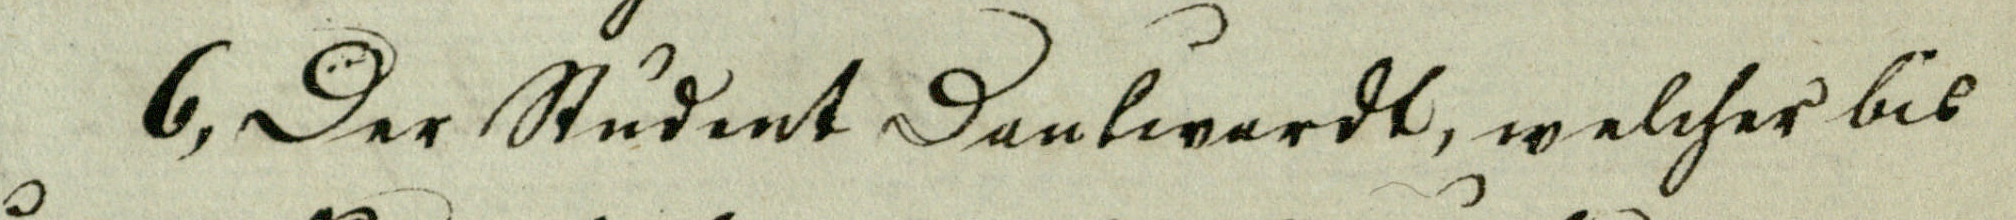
6, Der Student Dankwardt, welcher bis
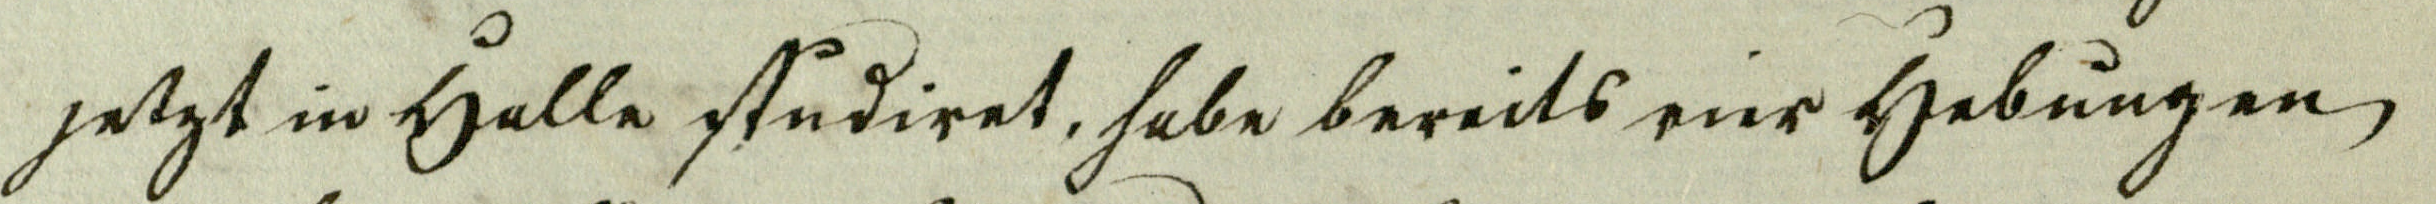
jetzt in Halle studiret, habe bereits vier Hebungen
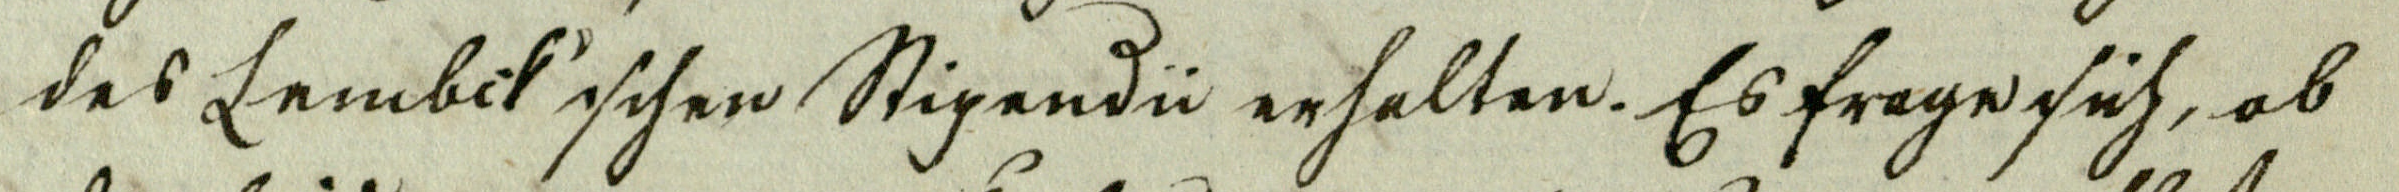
des Lembck'schen Stipendii erhalten. Es frage sich, ob
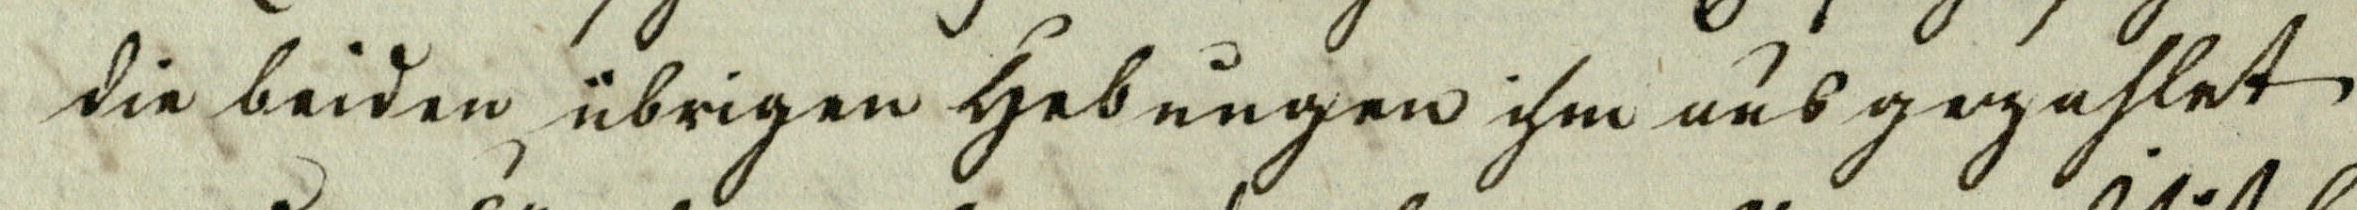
die beiden übrigen Hebungen ihm ausgezahlet
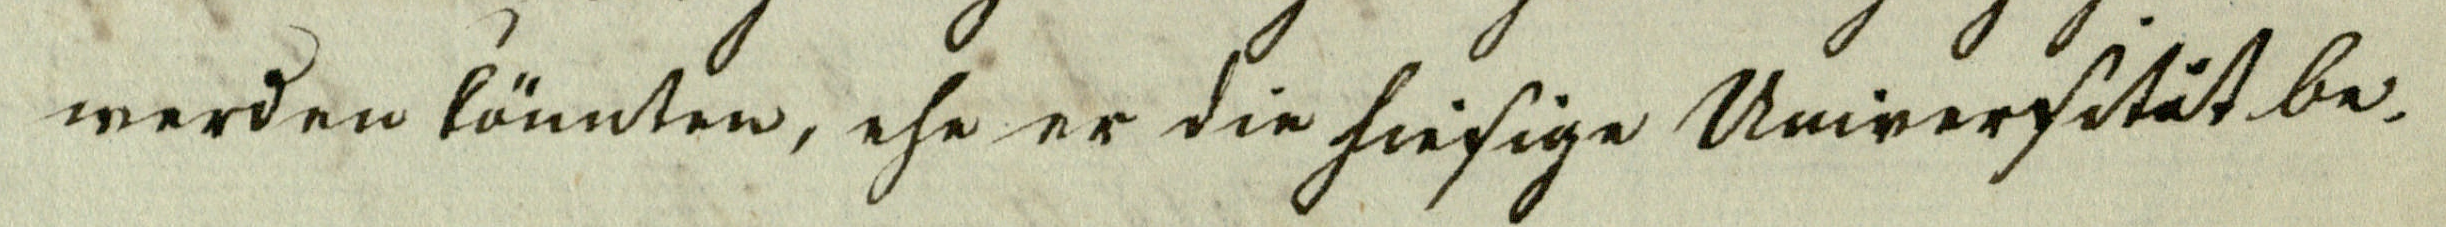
werden könnten, ehe er die hiesige Universität be¬
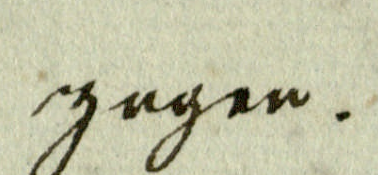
zogen.
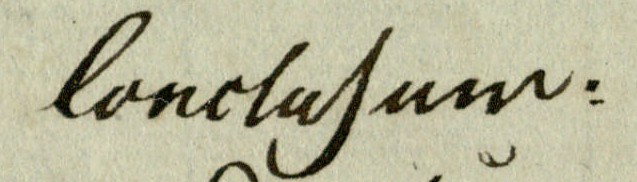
Conclusum:
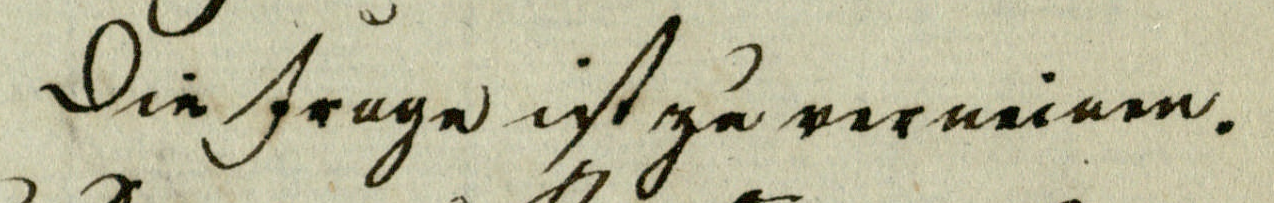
Die Frage ist zu verneinen.
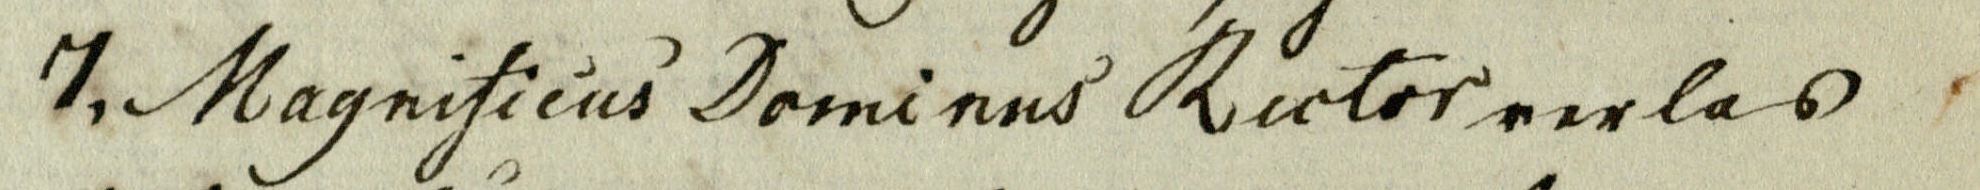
7, Magnificus Dominus Rector verlas
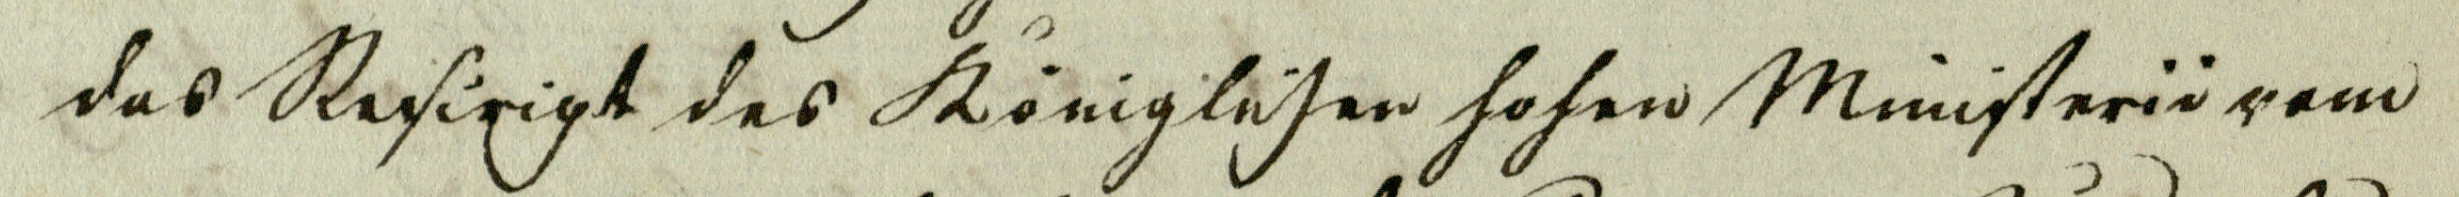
das Rescript des Königlichen hohen Ministerii vom
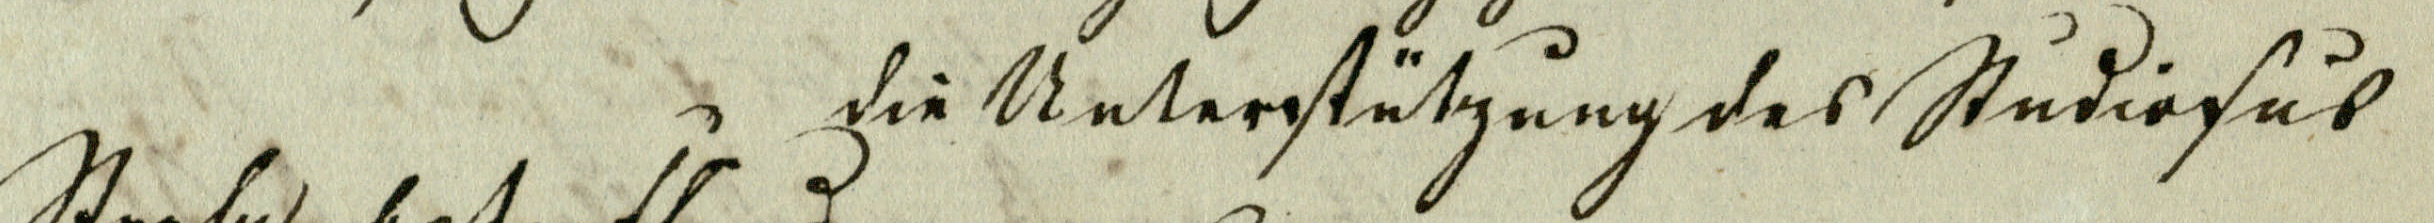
die Unterstützung des Studiosus
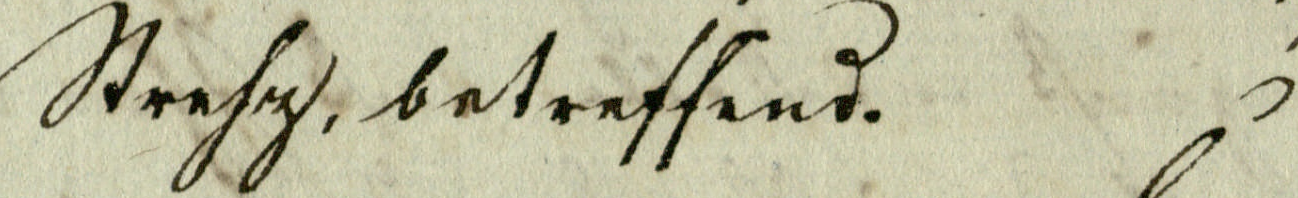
Strehz, betreffend.
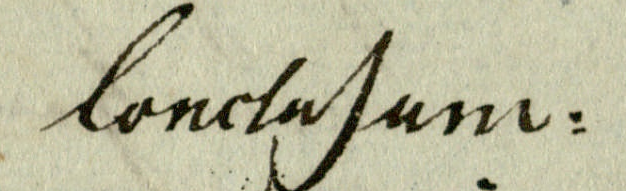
Conclusum:
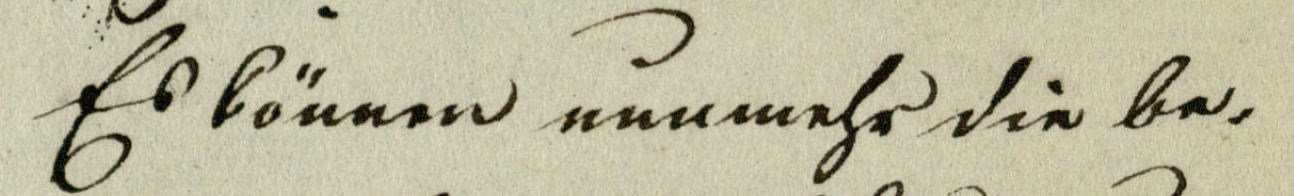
Es können nunmehr die be¬
